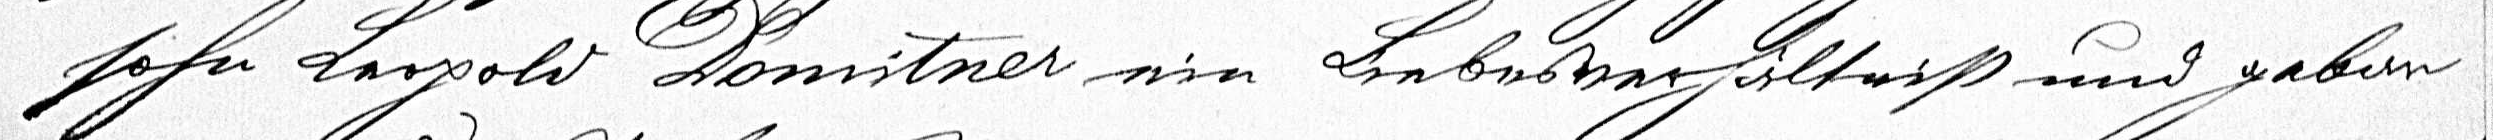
sohn Leopold Domitner ein Lebensverhältnis und gaben
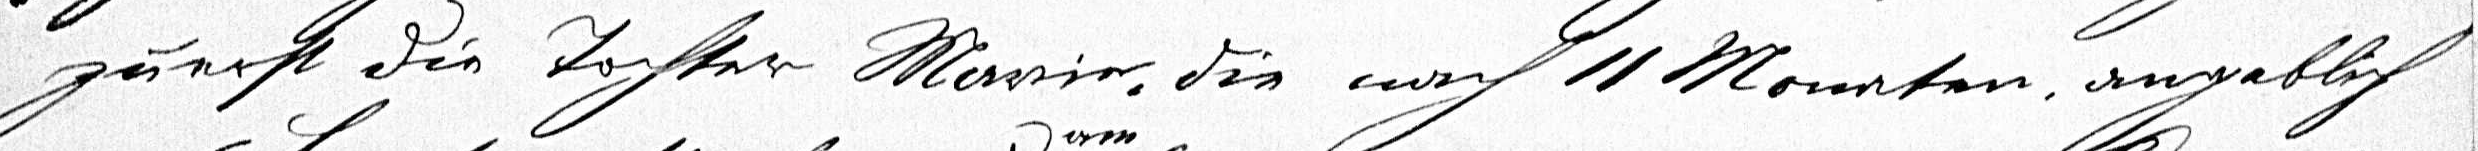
zuerst die Tochter Maria, die noch 11 Monaten, angeblich
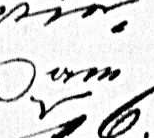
am
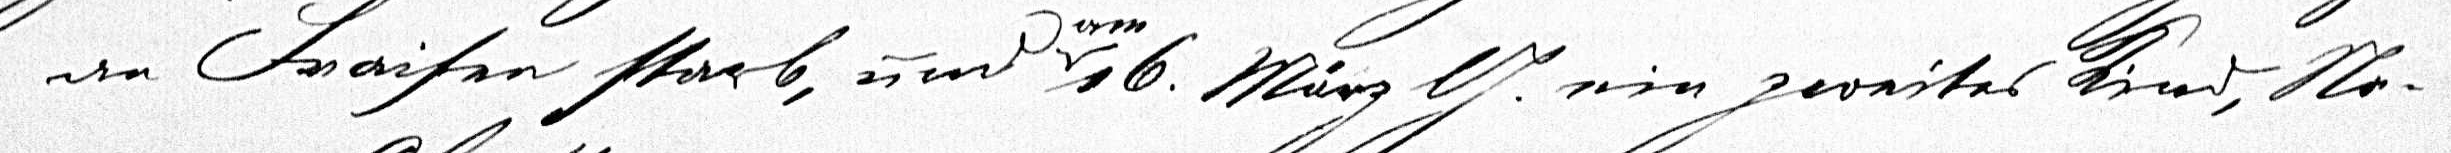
an Fraisen starb, und 16. März lJ. ein zweites Kind, Na¬
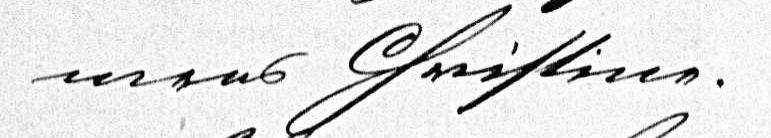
mens Christine.
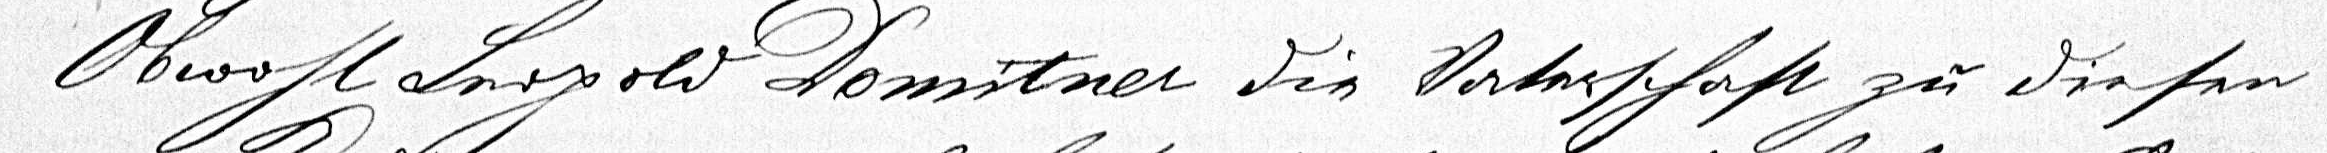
Obwohl Leopold Domitner die Vaterschaft zu diesen
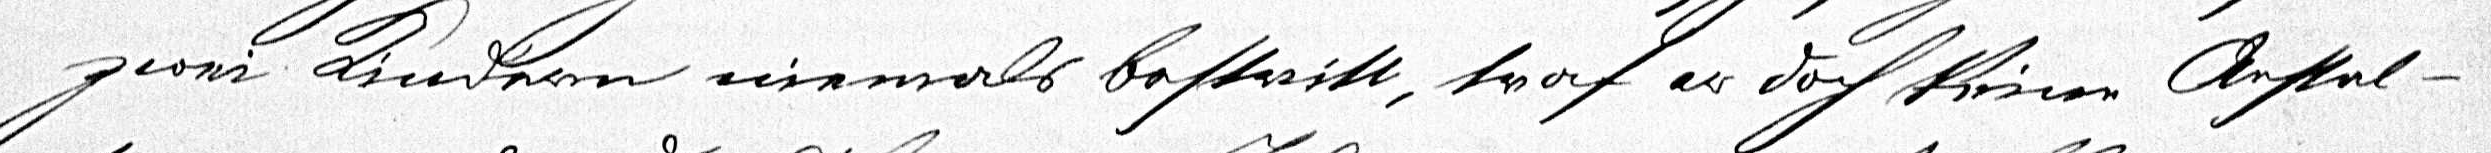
zwei Kindern niemals bestritt, traf er doch keine Anstal¬
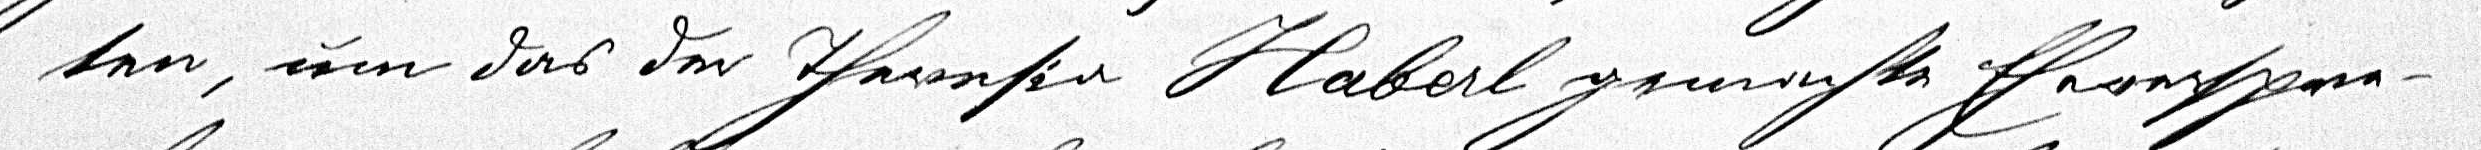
ten, um das der Theresia Haberl gemachte Eheverspre¬
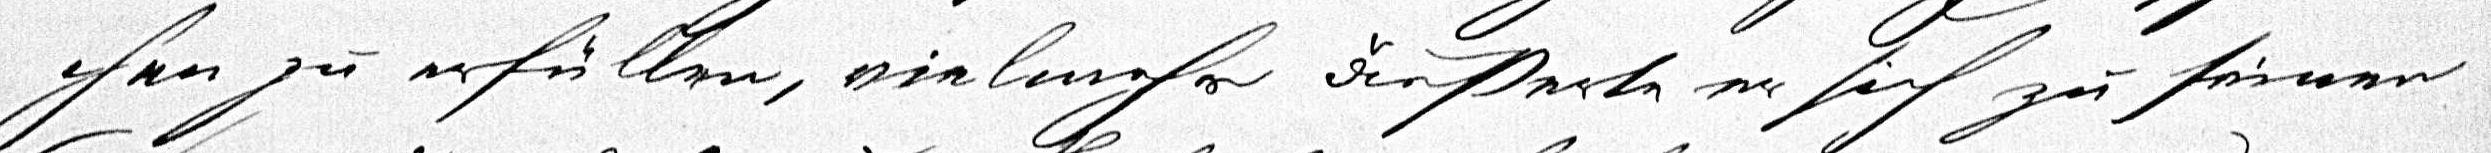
chen zu erfüllen, vielmehr äußerte er sich zu seinen
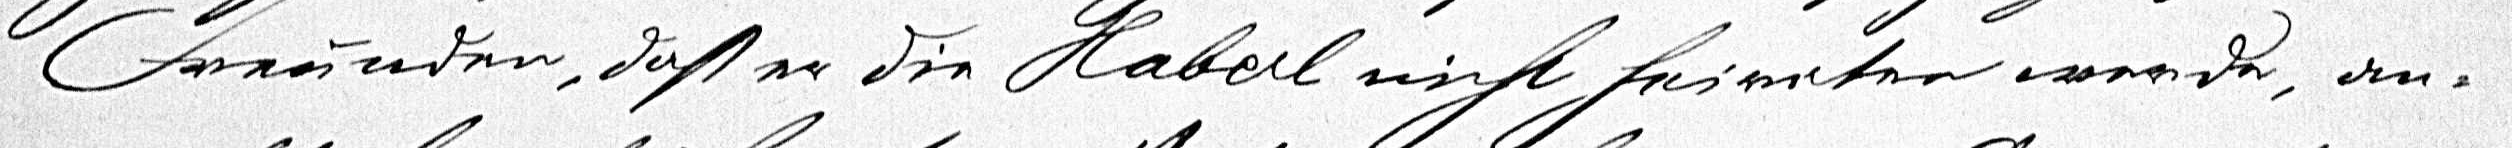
Freunden, daß er die Haberl nicht heiraten werde, an¬
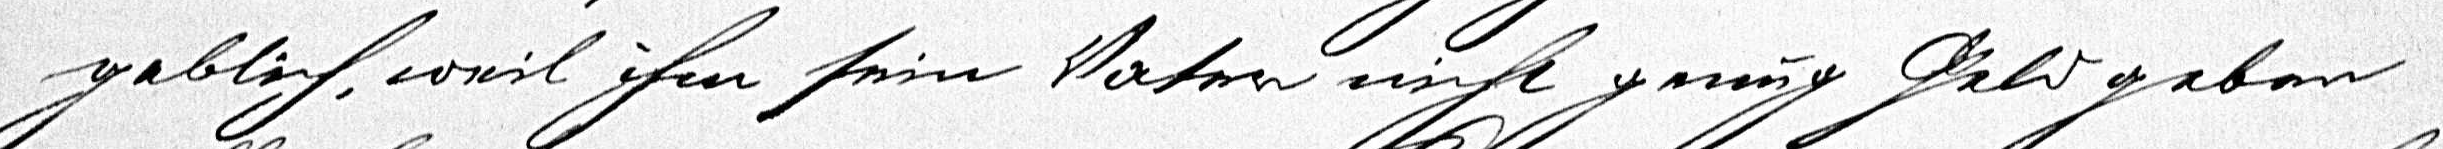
gelbich, weil ihm sein Vater nicht genug Geld geben
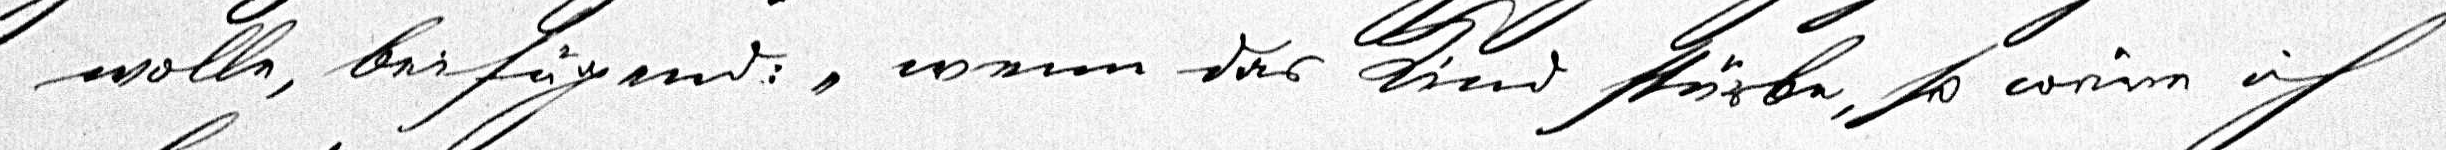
wolle, beifügend: „wenn das Kind stürbe, so wäre ich
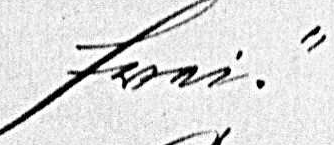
frei.“
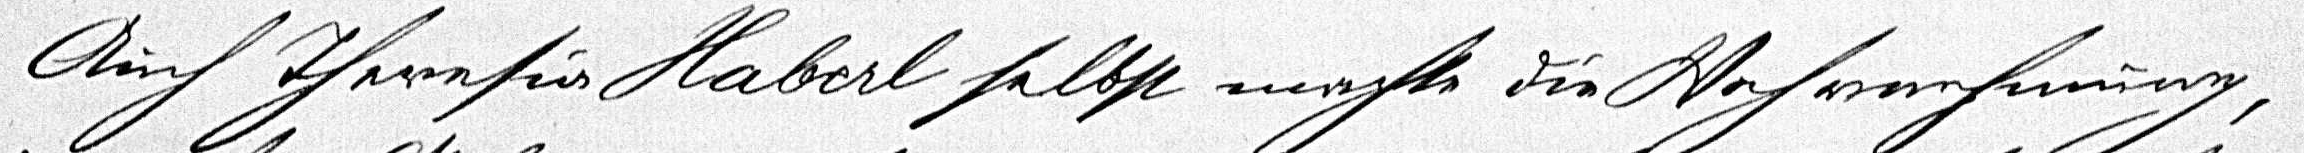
Auch Theresia Haberl selbst machte die Wahrnehmung,
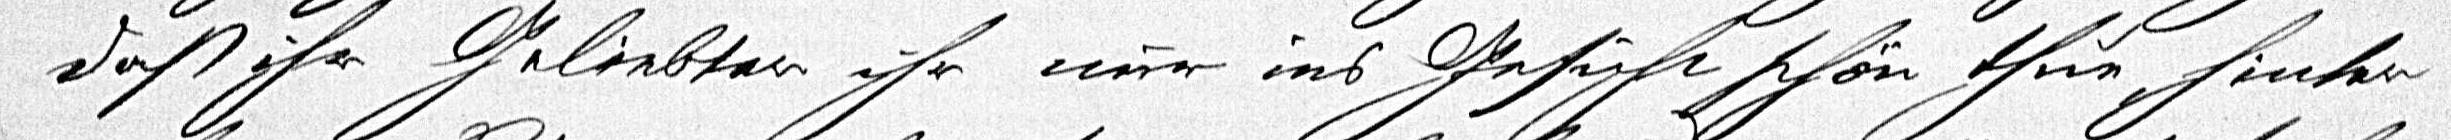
daß ihr Geliebter ihr nur ins Gesicht schön thun hinter
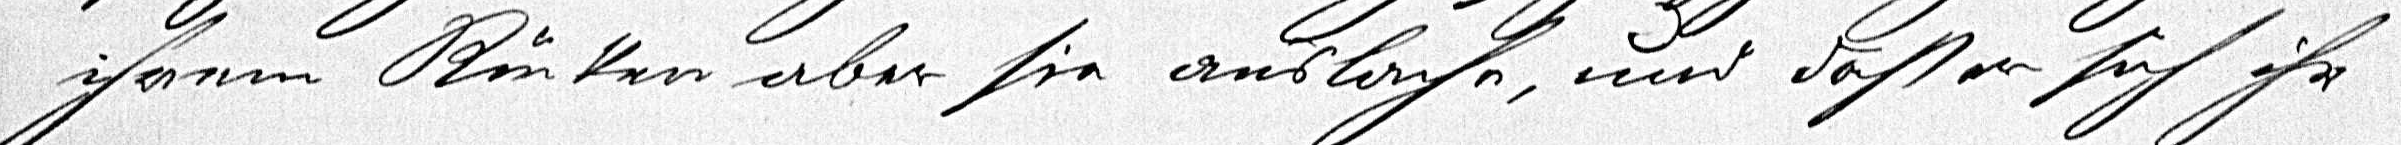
ihrem Rücken aber sie auslache, und daß er sich ihr
